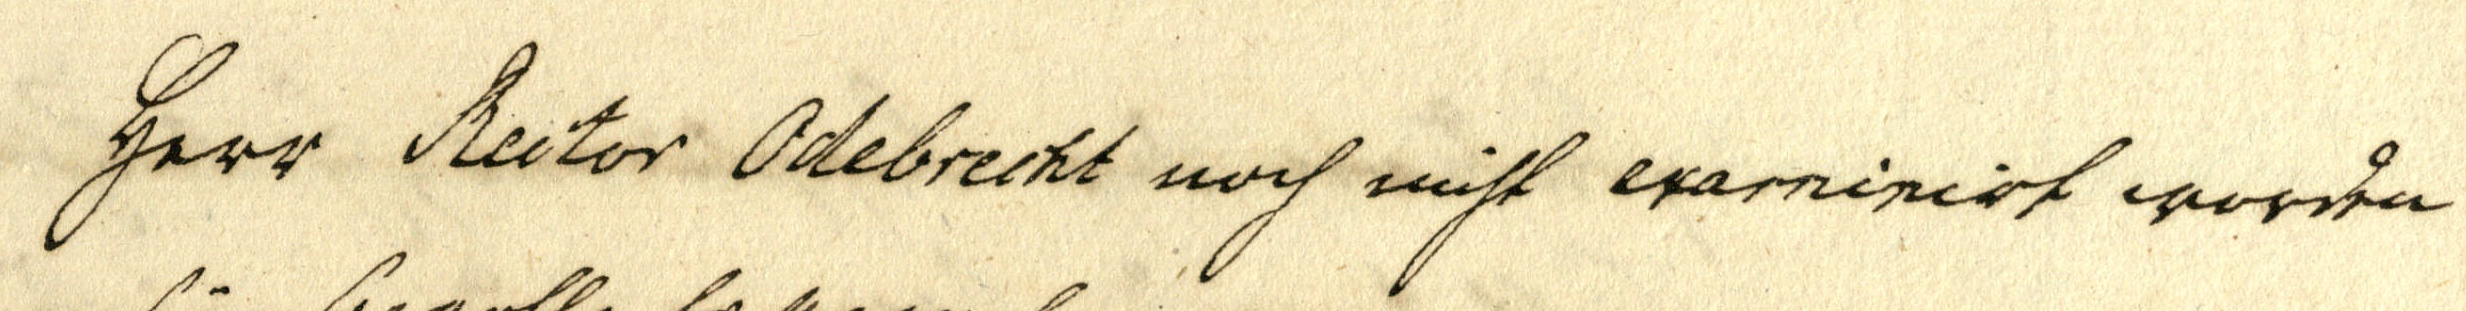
Herr Rector Odebrecht noch nicht examinirt worden
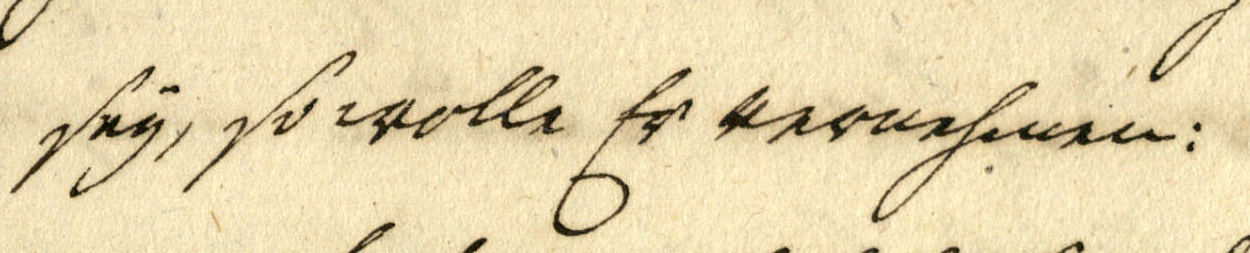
seÿ, so wolle Er vernehmen:
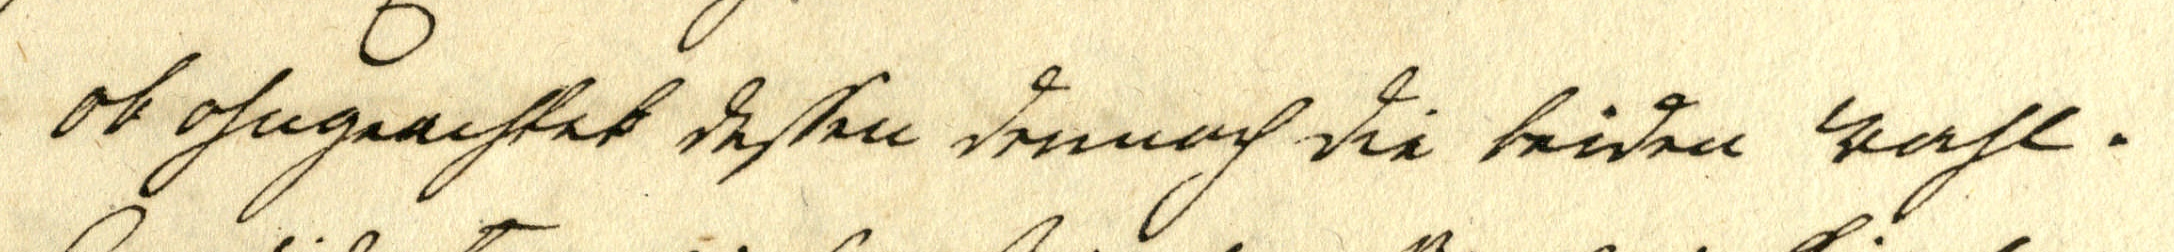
ob ohngeachtet dessen dennoch die beiden Wahl-
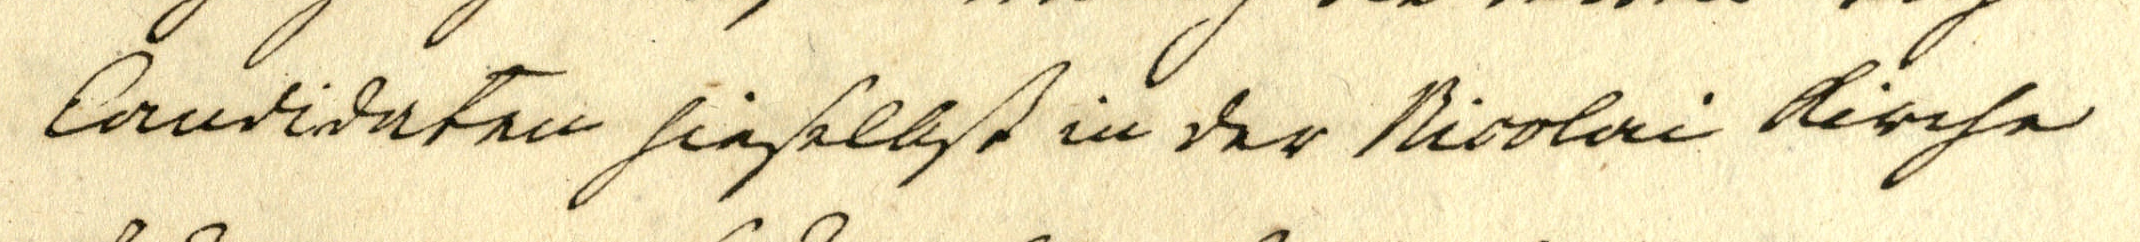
Candidaten hieselbst in der Nicolai Kirche
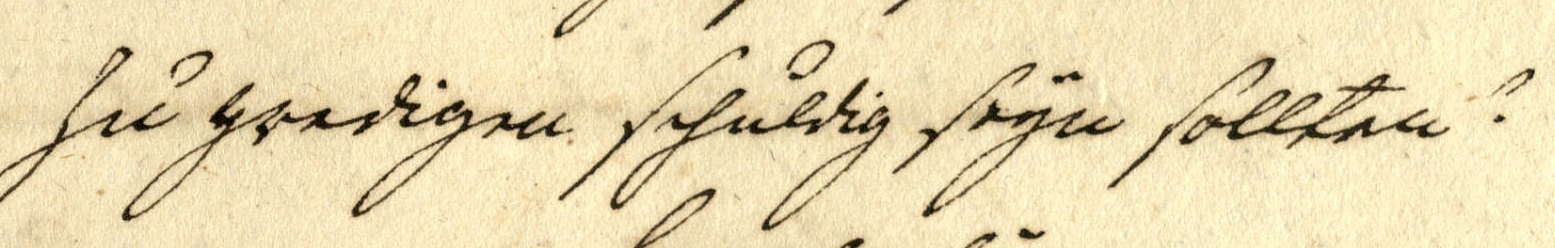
zu predigen schuldig seÿn sollten?
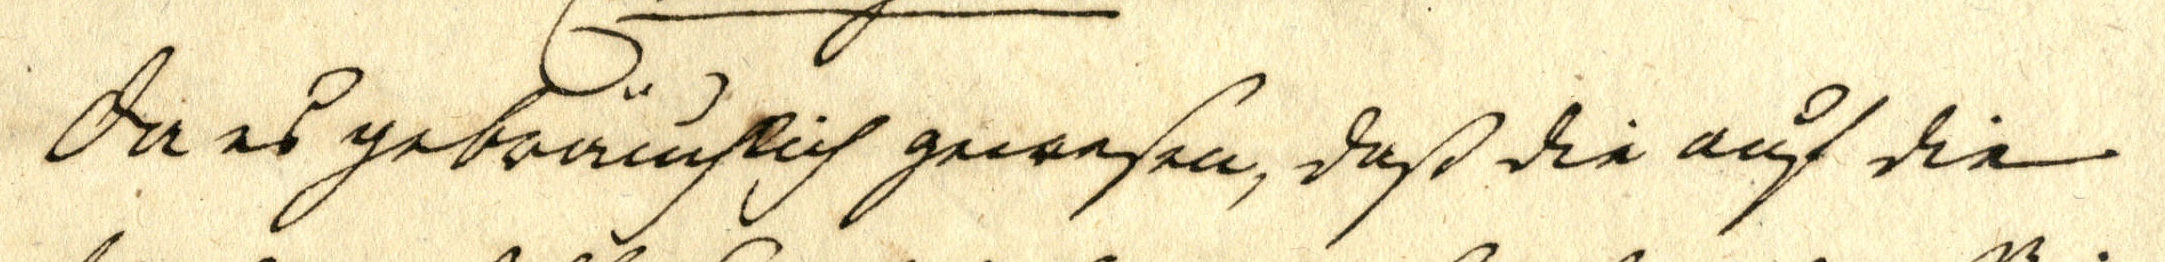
Da es gebräuchlich gewesen, daß die auf die
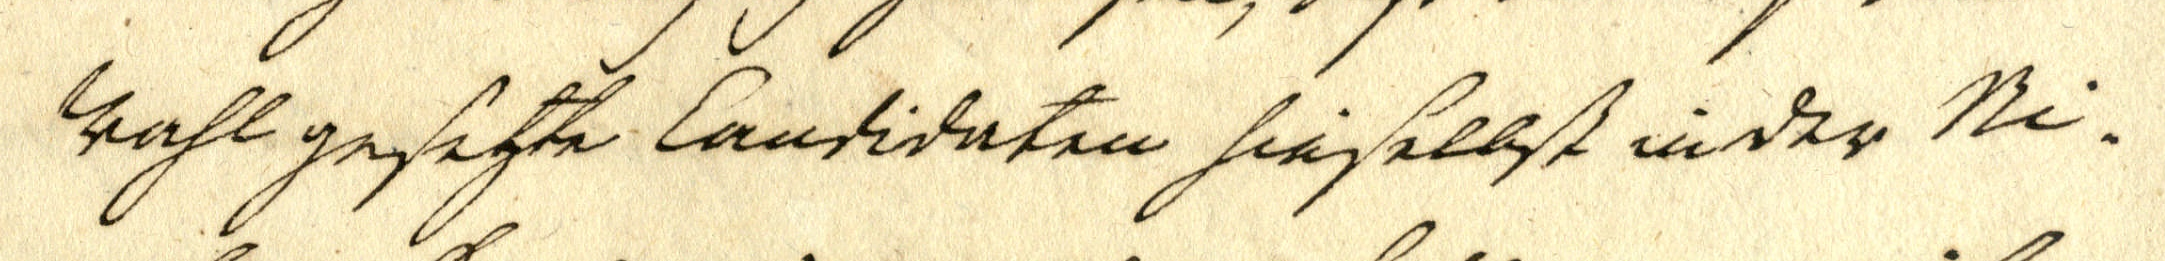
Wahl gesetzte Candidaten hieselbst inder Ni¬
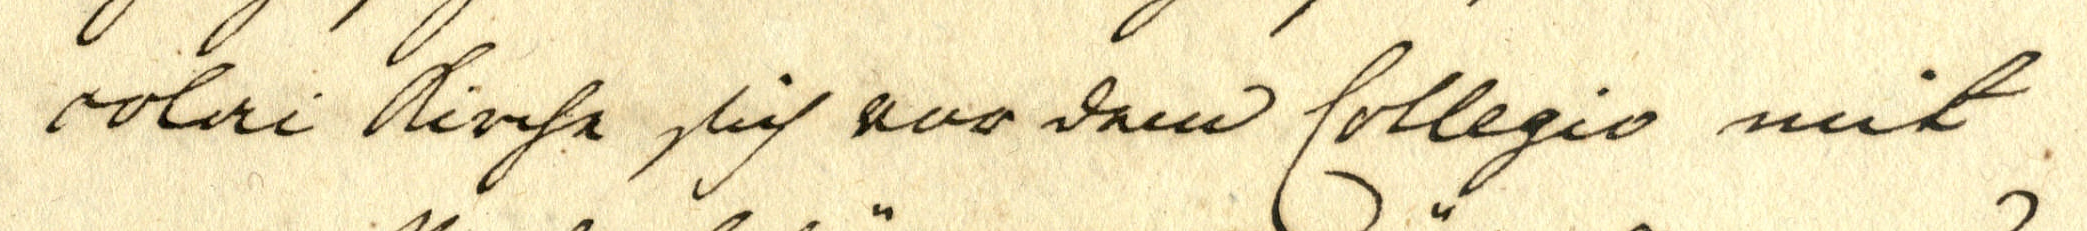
colai Kirche sich vor dem Collegio mit
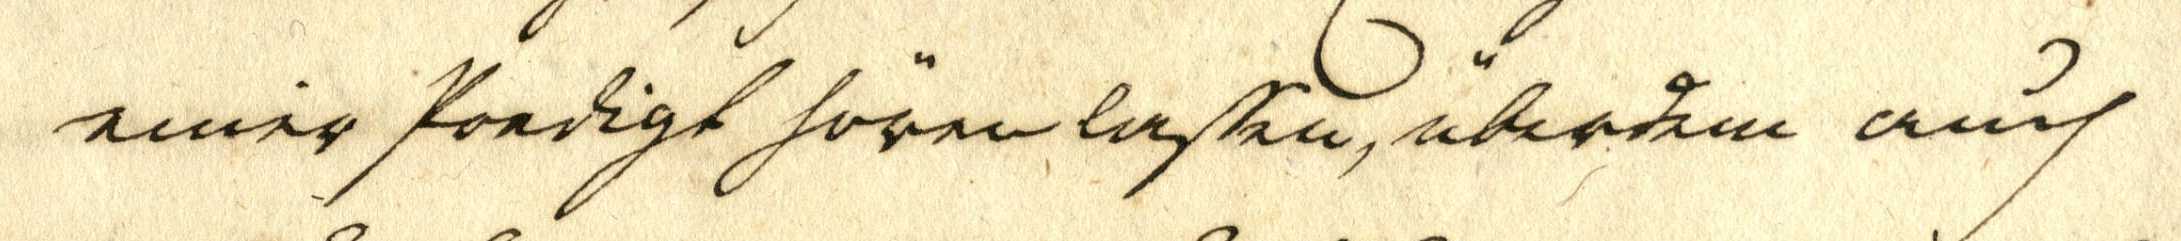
einer Predigt hören lassen, überdem auch
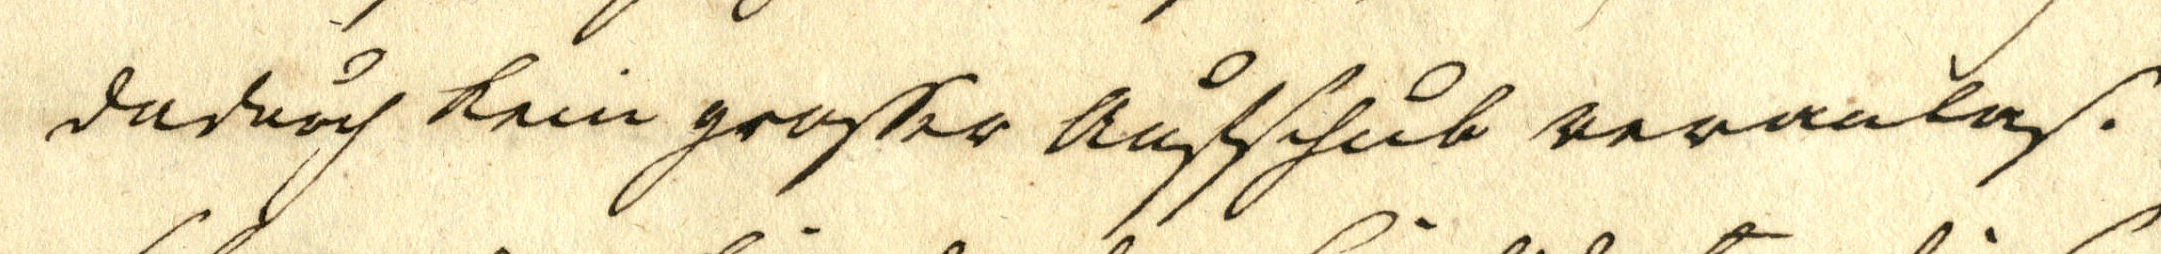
dadurch kein grosser Aufschub veranlas¬
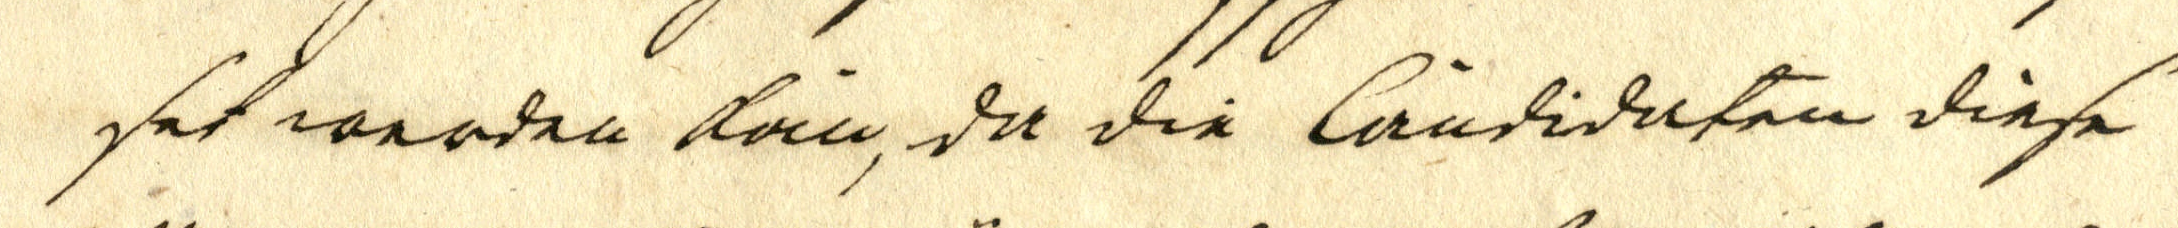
set werden kan, da die Candidaten diese
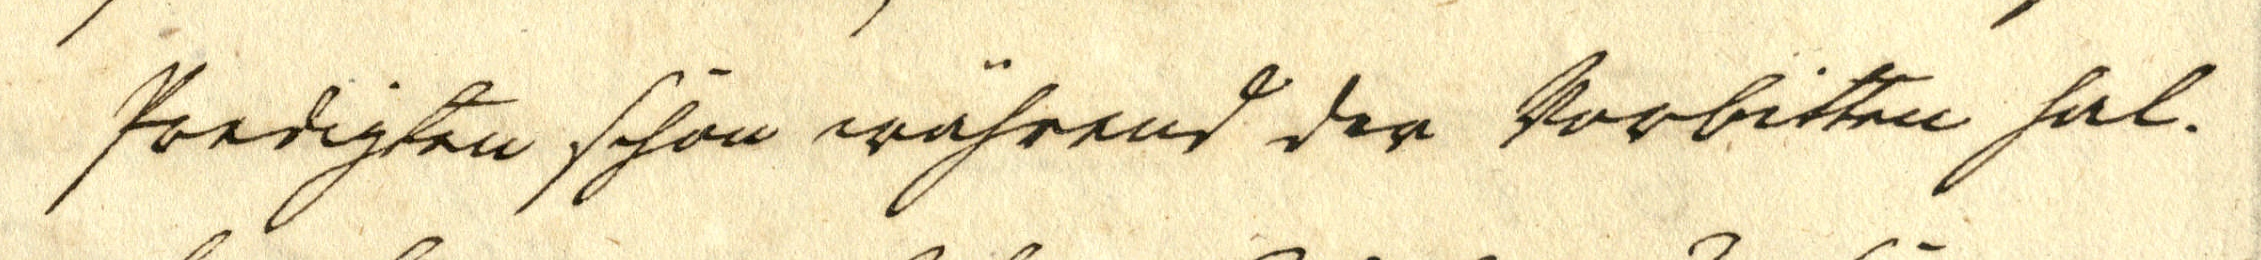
Predigten schon während der Vorbitten hal¬
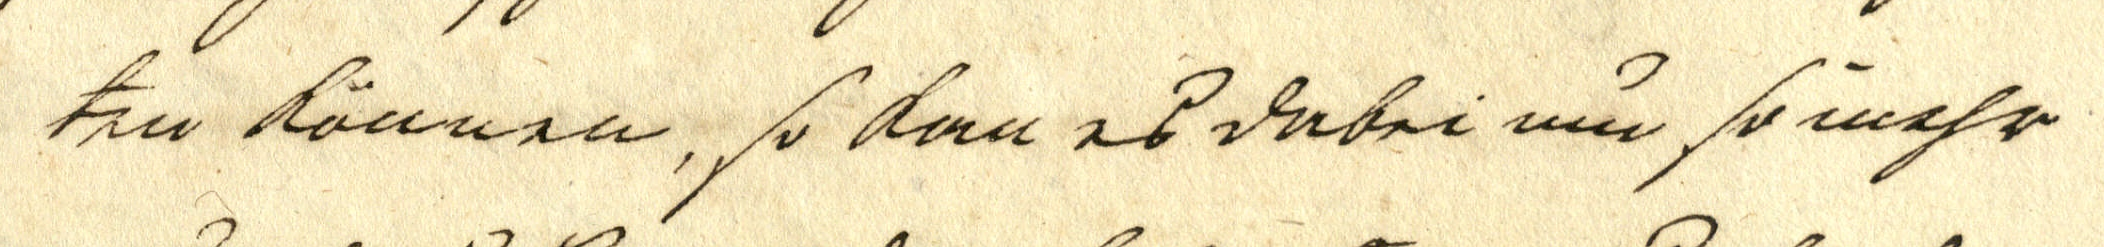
ten können, so kan es dabei um so mehr
